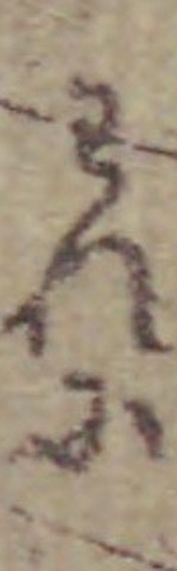われに
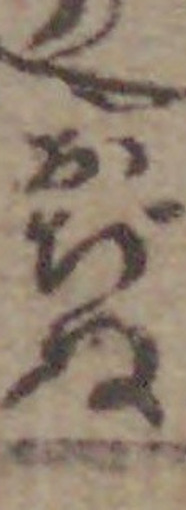おぢぬ
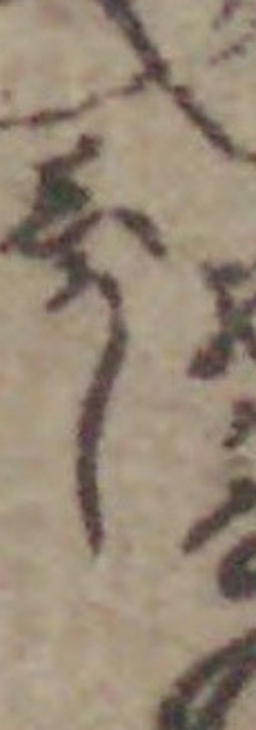しかし
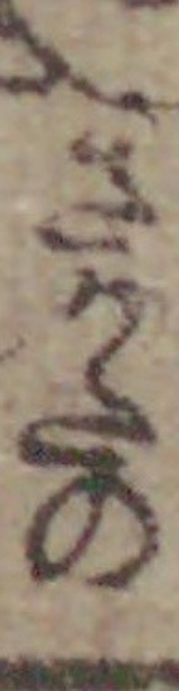さかたの
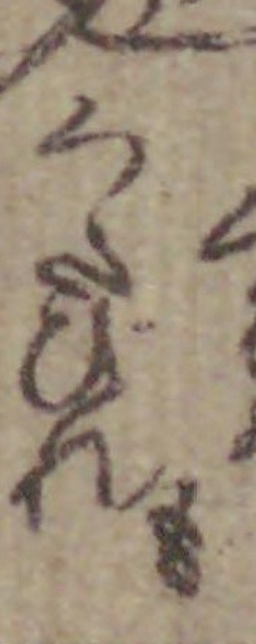くたびれ
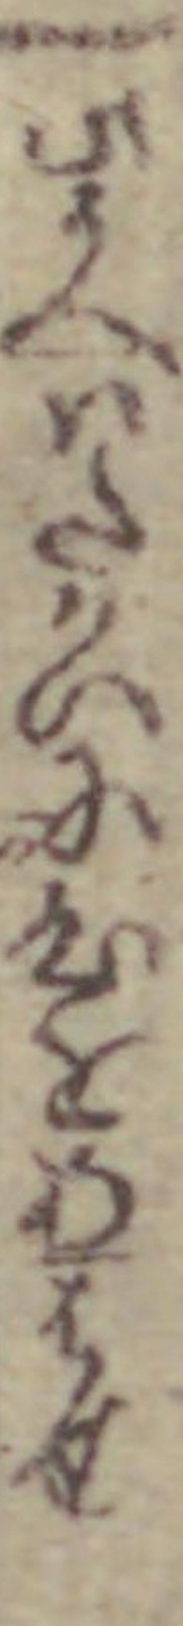此うへはたかいに心をあはせ
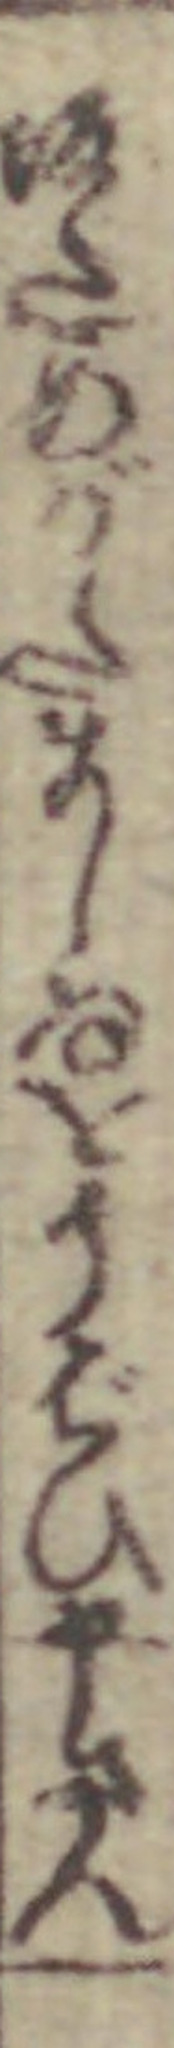坂ためがたましゐをうばひ申さん
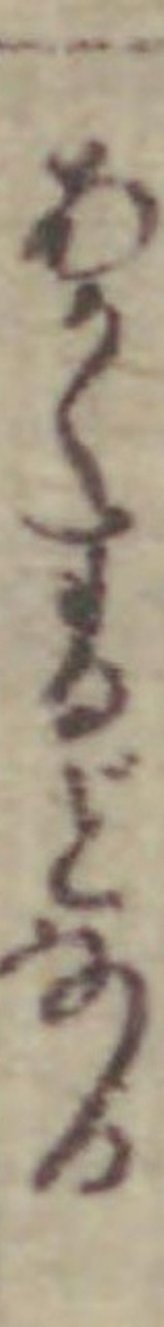あかくするどなる
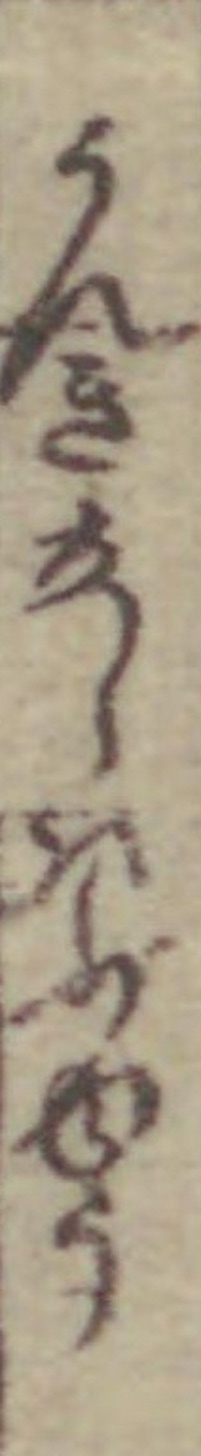うんき立しはぶゆう
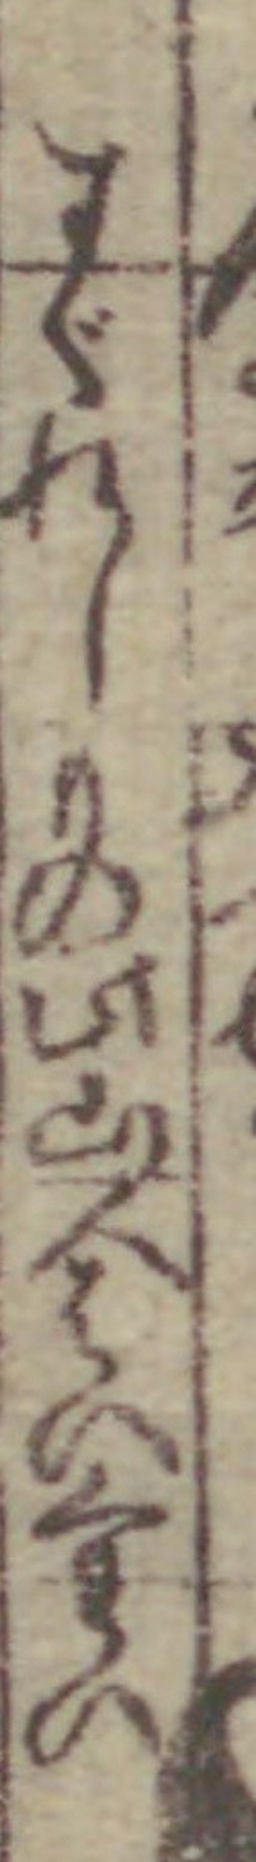すぐれしもの此山人はいくわい
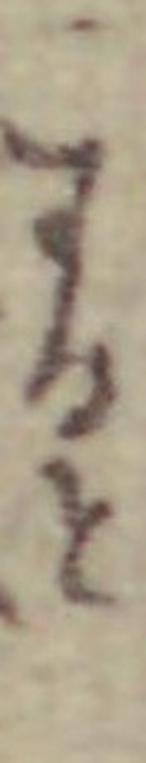すると
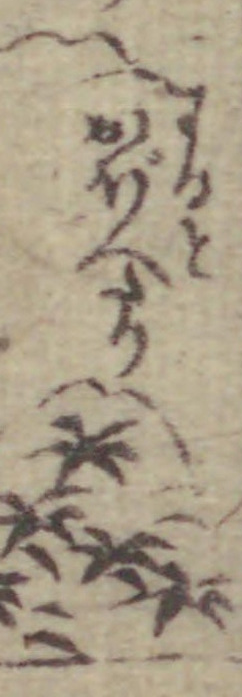おぼへたり
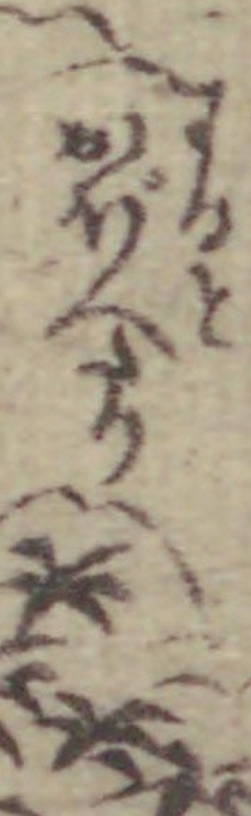おぼへたり
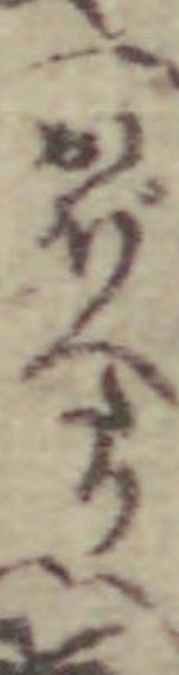おぼへたり

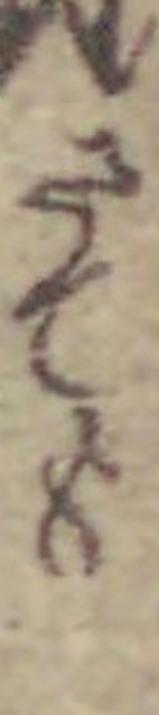さても
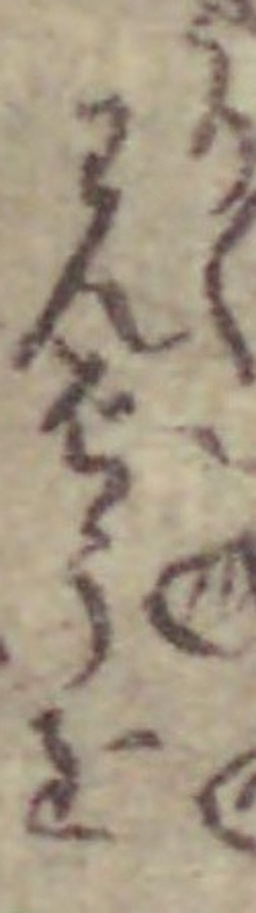わんばうを
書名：妖怪雪濃段 2巻
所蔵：国立国会図書館 National Diet Library, JAPAN
